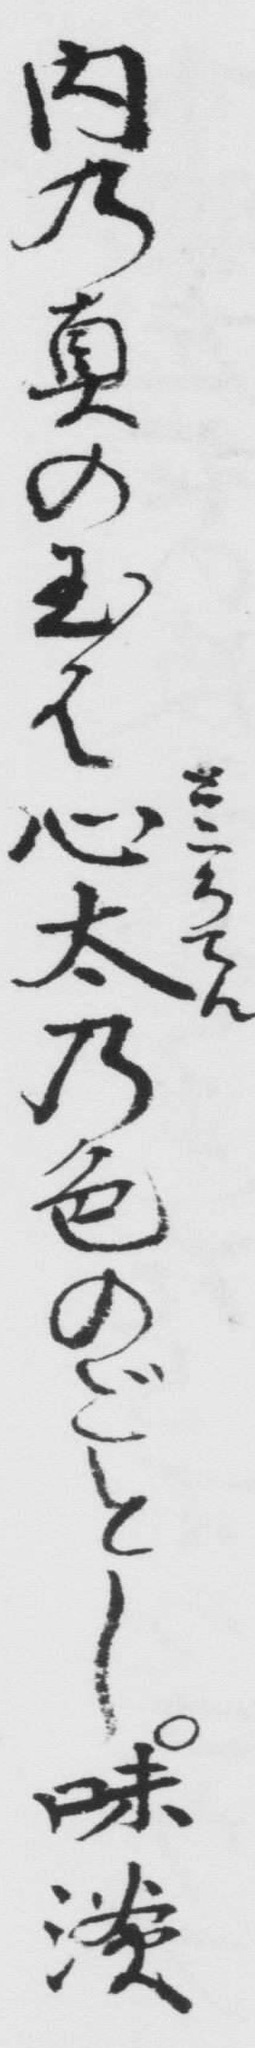内の真の玉は心太の色のごとし。味淡
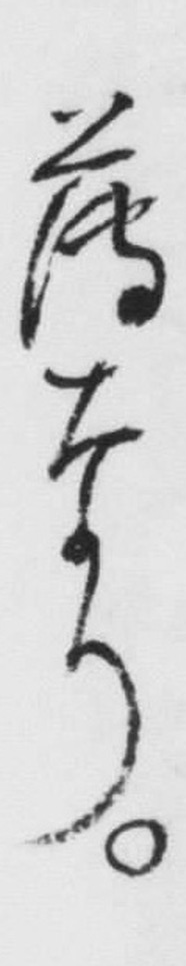薄なり。
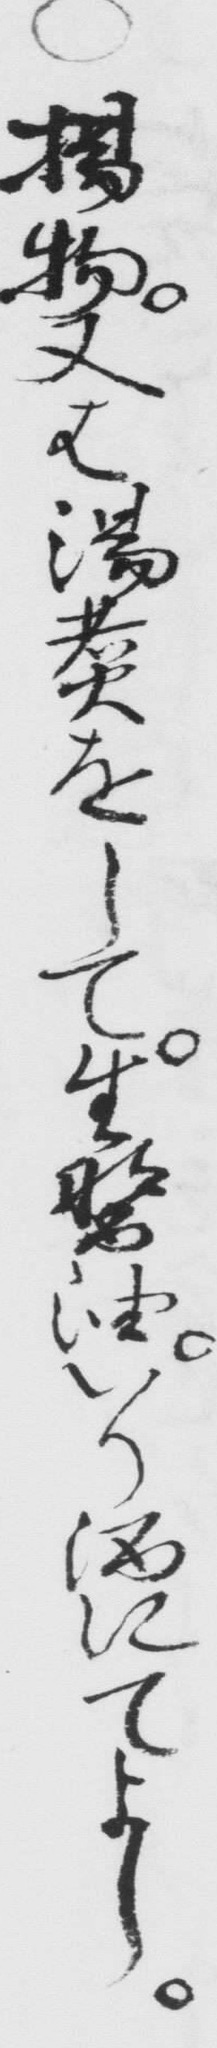○揚物。又は湯葉をして。生醤油。いり酒にてよし。
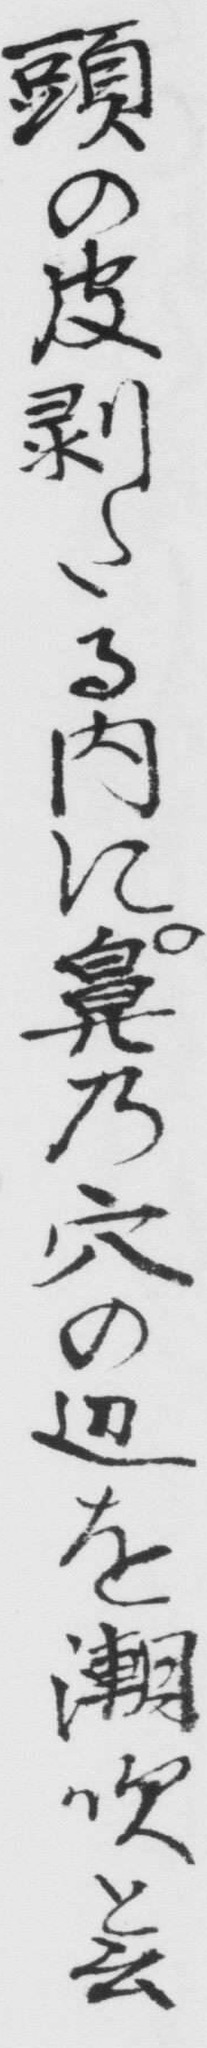潮吹頭の皮剥きたる内に。鼻の穴の辺を塩吹と云
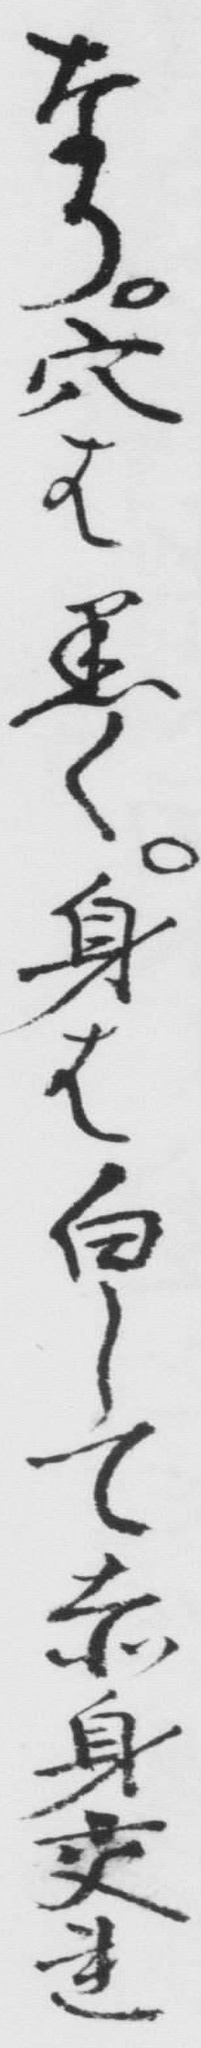なり。穴は黒く。身は白して赤身交れ
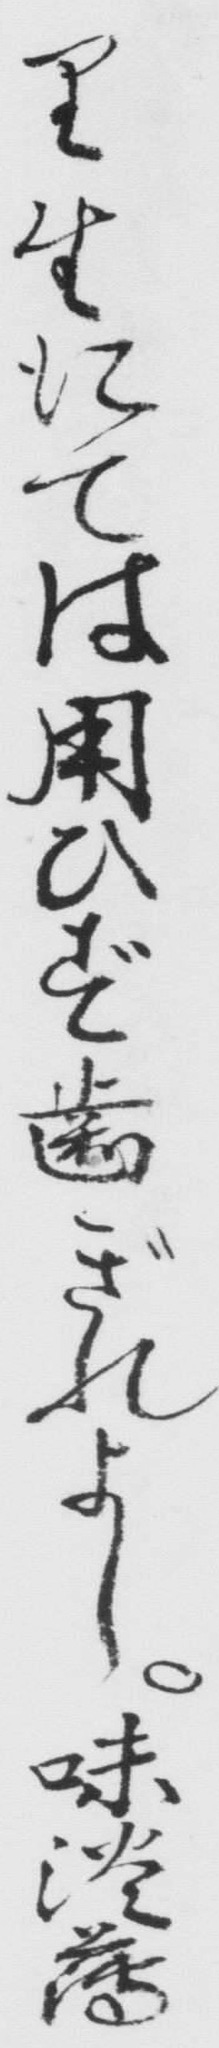り生にては用ひず歯ぎれよし。味淡薄

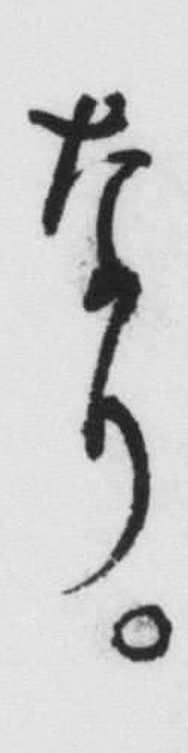なり。
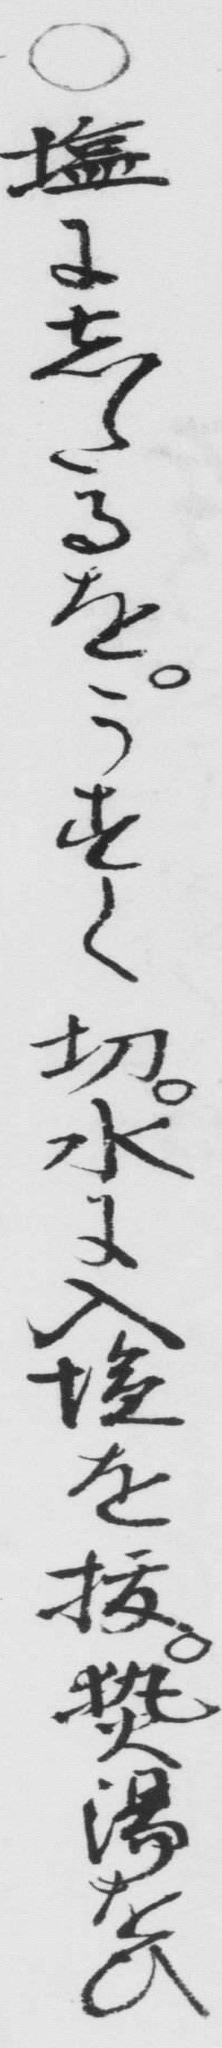○塩にしたるを。うすく切。水に入塩を抜。熱湯をひ
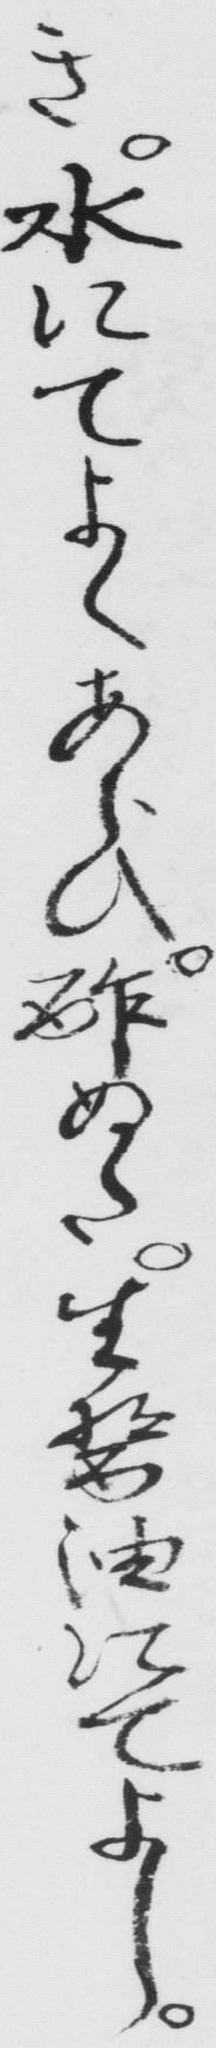き。水にてよくあらひ。酢ぬた。生醤油にてよし。
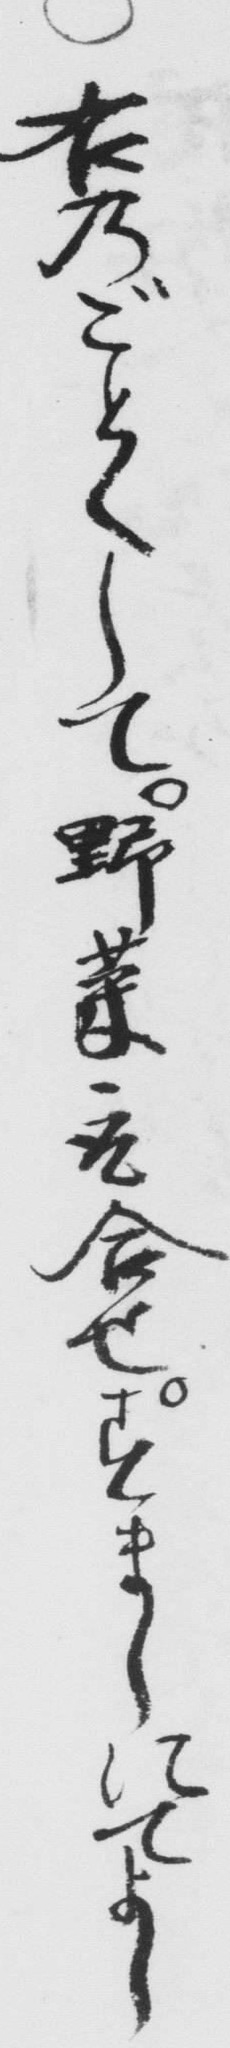○右のごとくして。野菜取合せ。すましにてよし
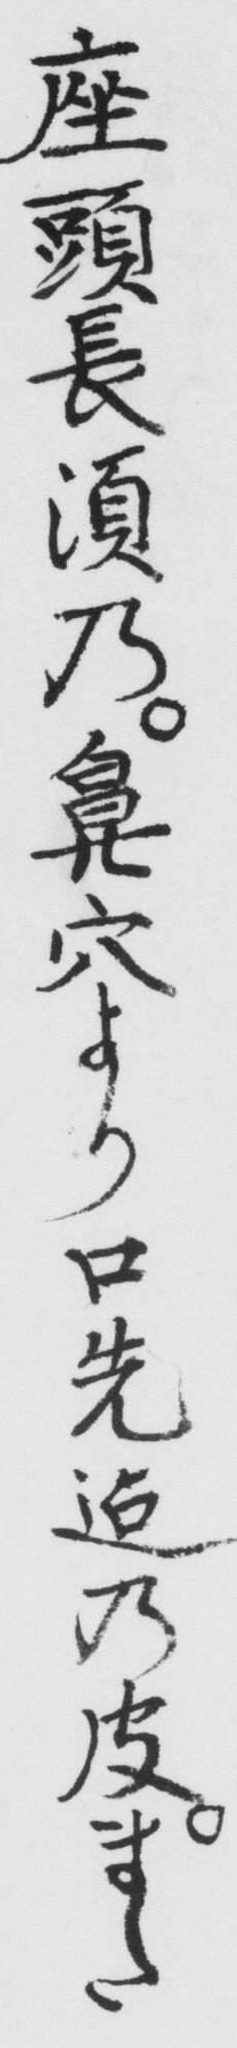コウブ座頭長須の。鼻穴より口先迄の皮。また
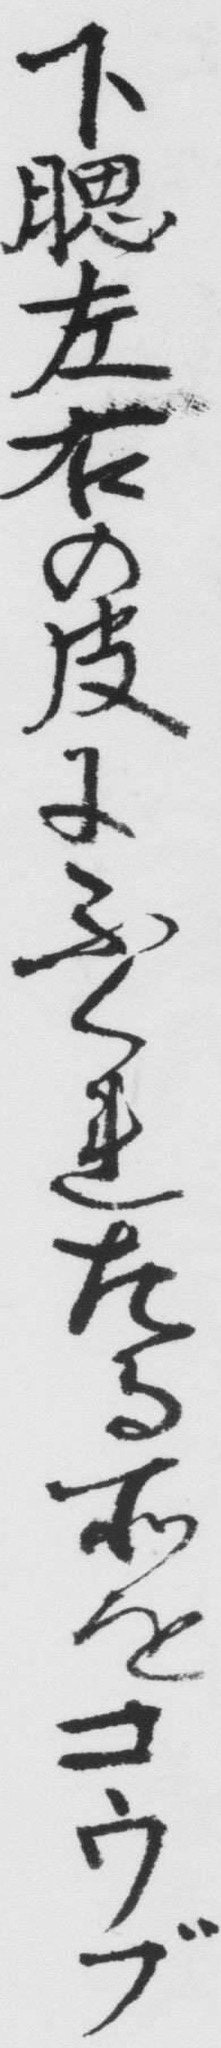下腮左右の皮にふくれたる所をコウブ
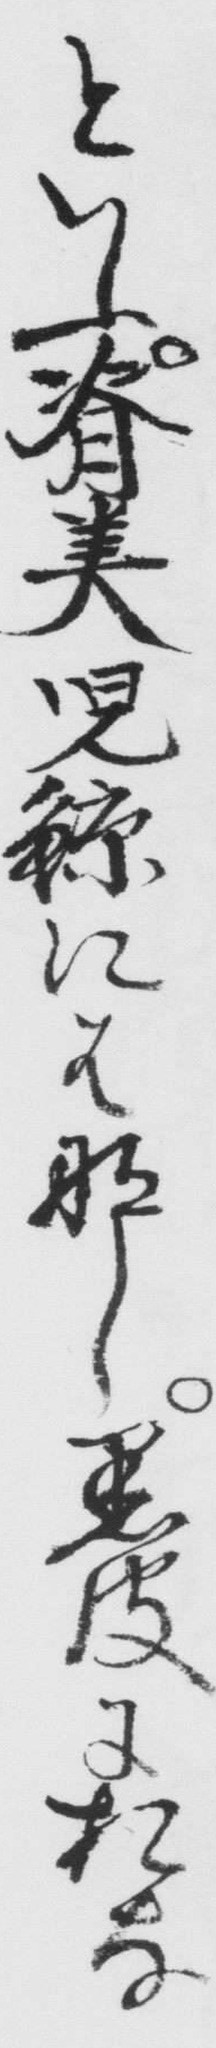といふ。背美児鯨にはなし。黒皮におな
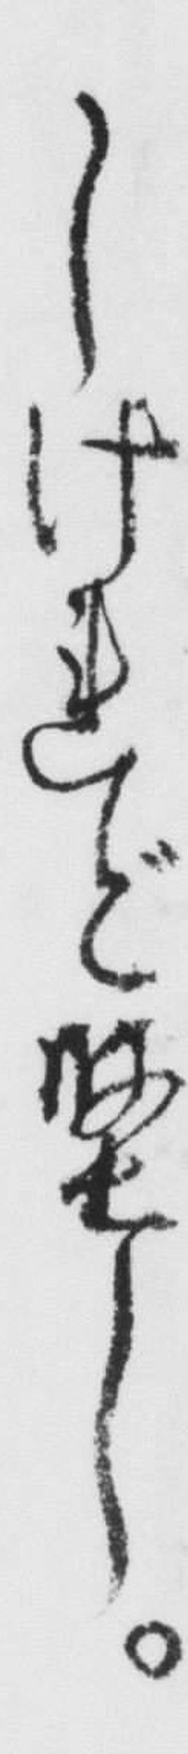しけれど堅し。
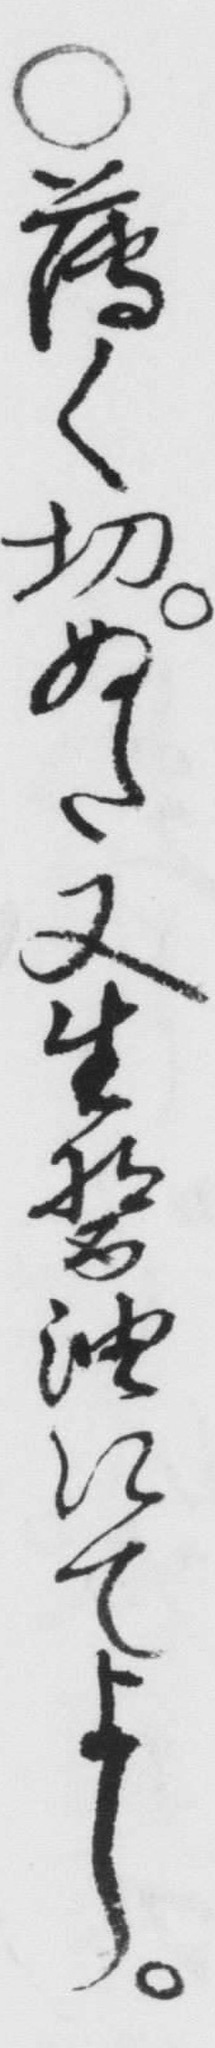○薄く切。ぬた又生醤油にてよし。
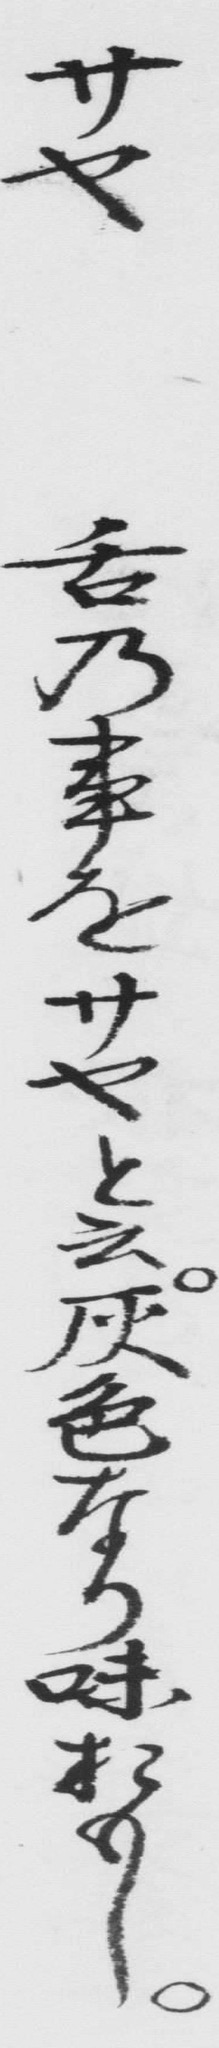サヤ舌の事をサヤと云。灰色なり味おもし。
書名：鯨肉調味方
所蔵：大阪府立大学学術情報センター 国文学研究資料館
